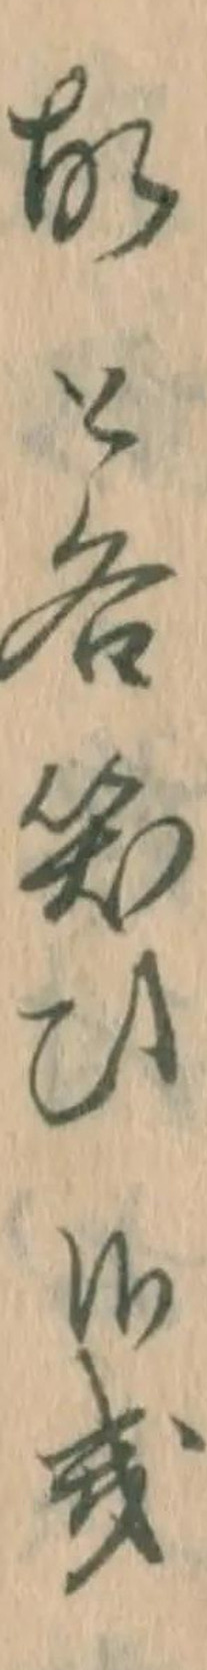故と各笑ひ候哉
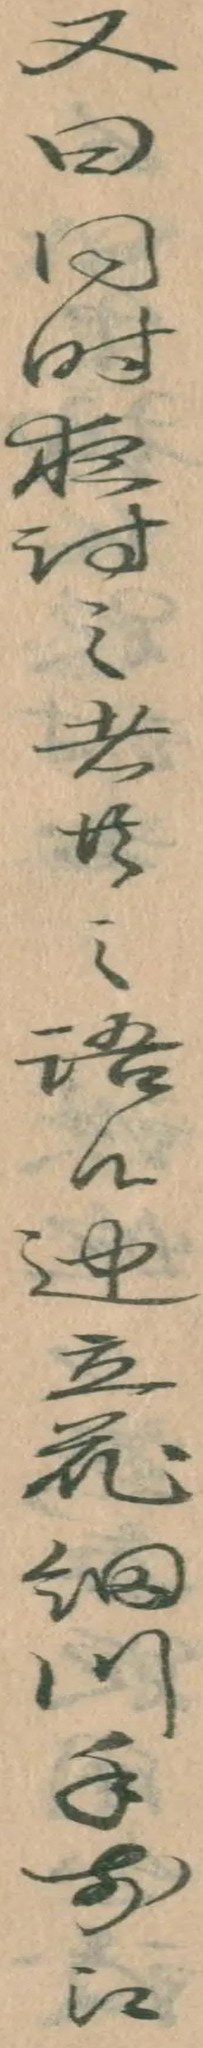又曰同時夜討之者共之語候迚立花細川手前江
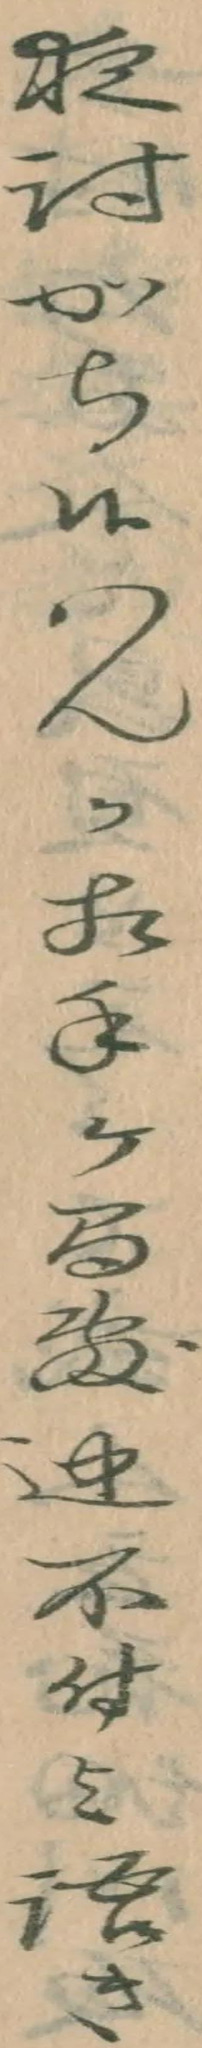夜討加ち候はんか相手け間敷迚不付与語き

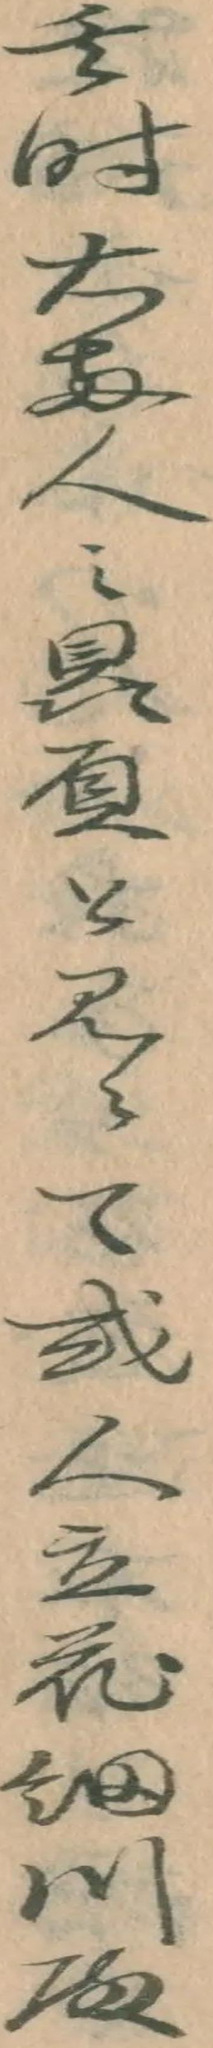其時右両人之贔屓と見えて或人立花細川殿
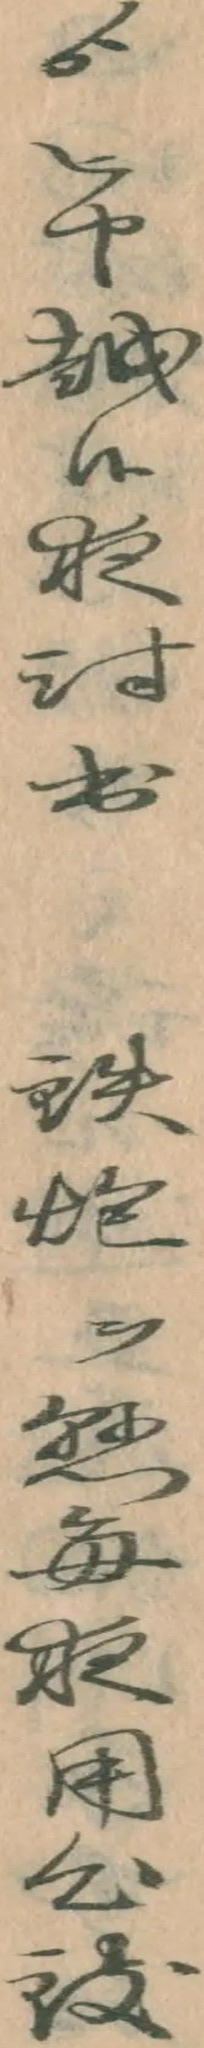ゟ被申越候夜討出鉄炮を惣毎夜用心致
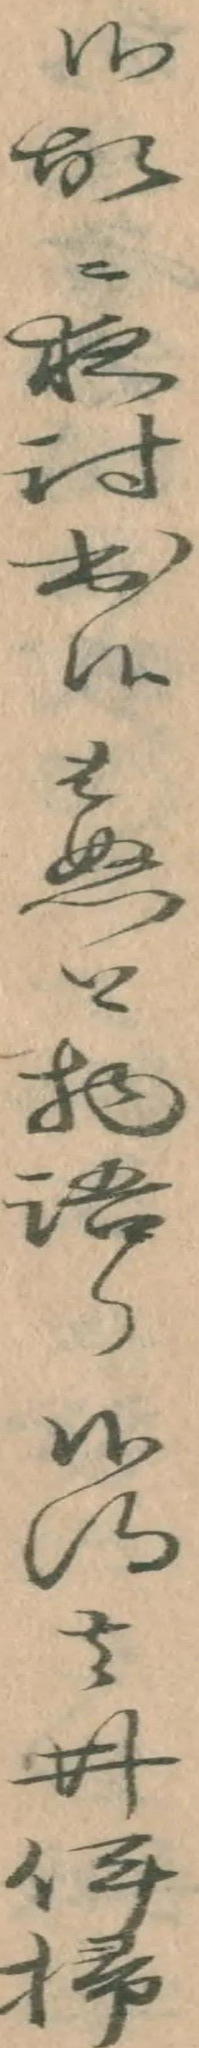候故に夜討出候者怒と物語り候得者井伊掃
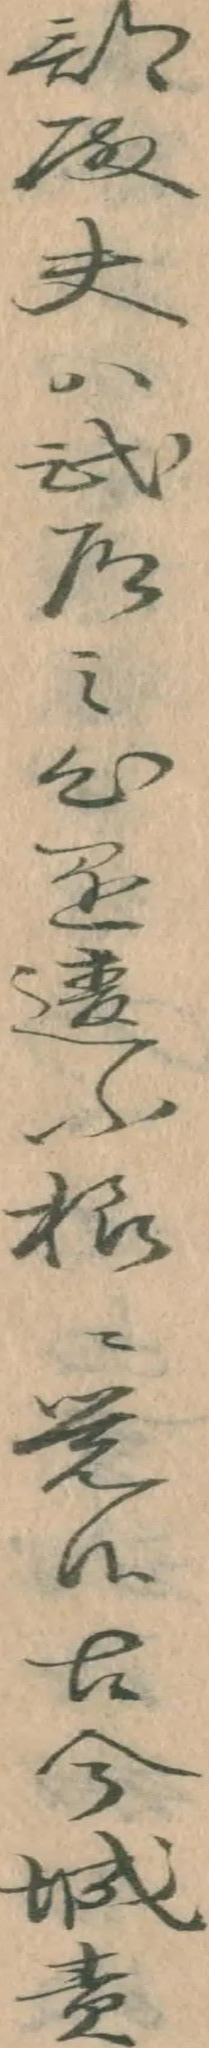部殿夫は武道之心懸違ふ様に覚候古今城責
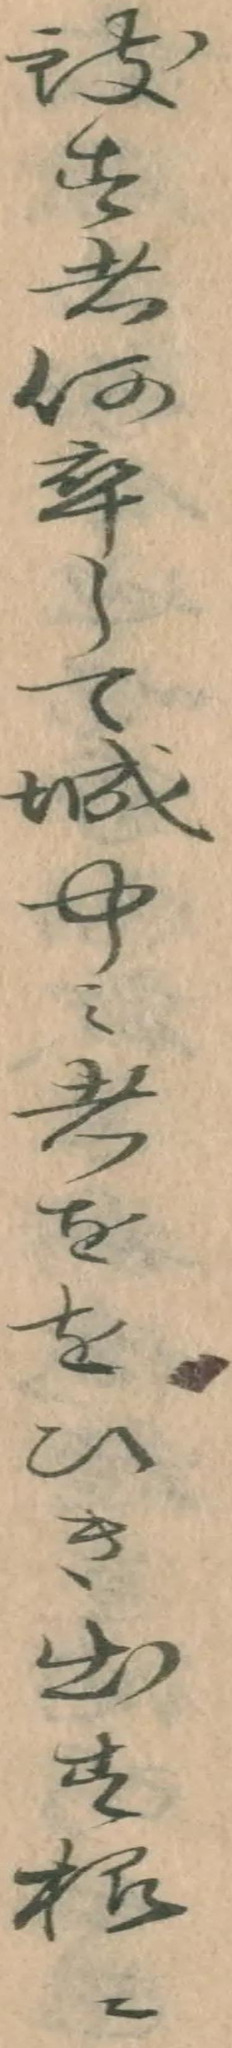致春者何卒して城中之者ををひき出春様に
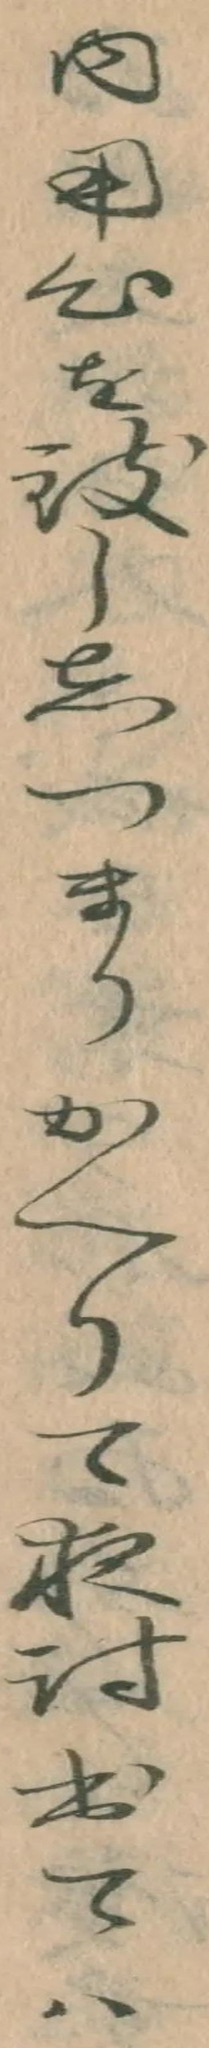内用心を致し志つまりかへりて夜討出ては
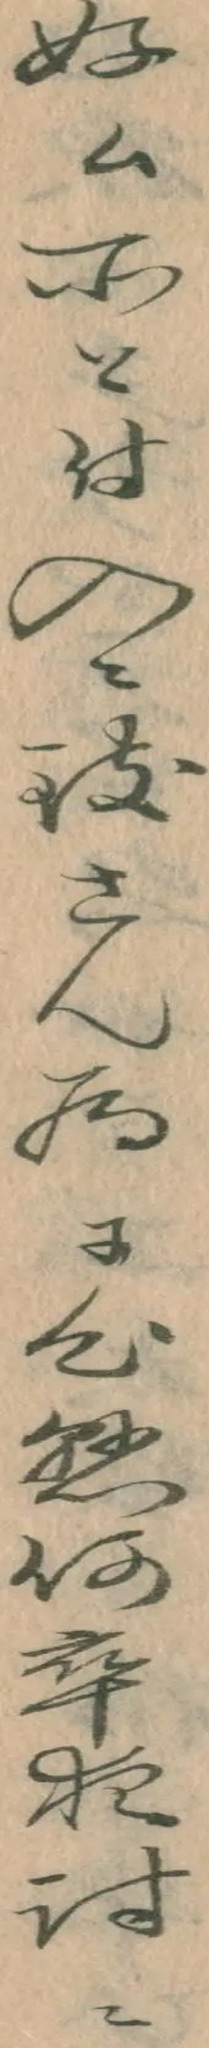好む所と付入に致さん為尓心懸何卒夜討に
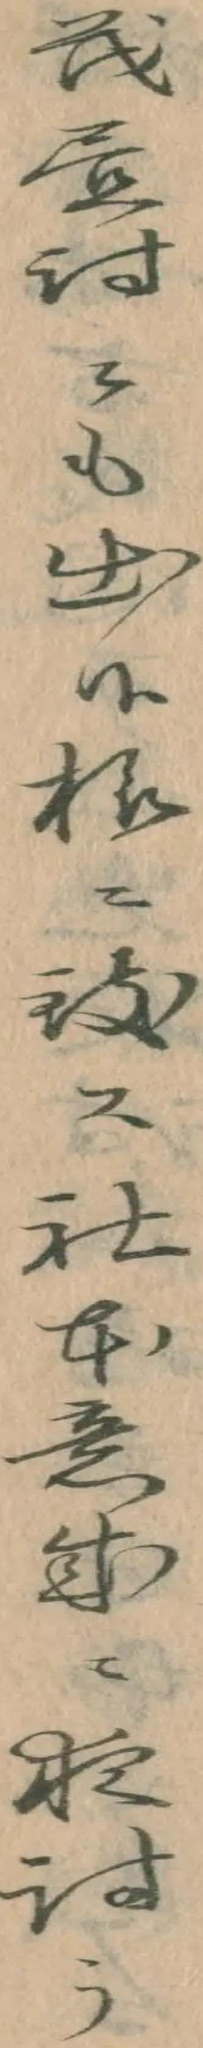茂昼討にも出候様に致す被本意成に夜討う
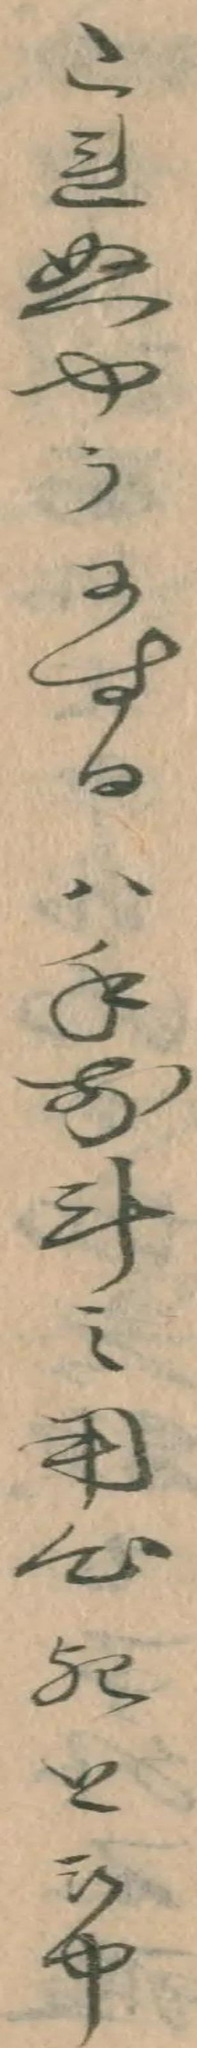た連怒やう尓するは手前斗之用心歟と被申
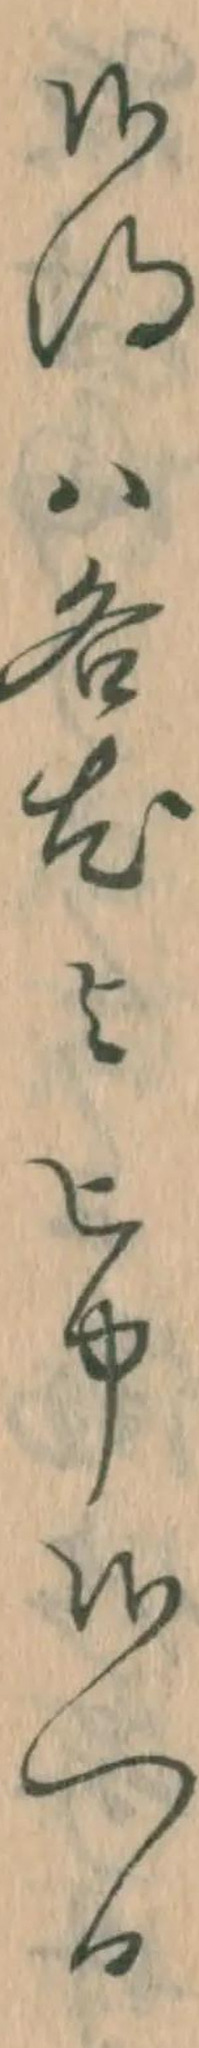候得は各尤与被申候つる
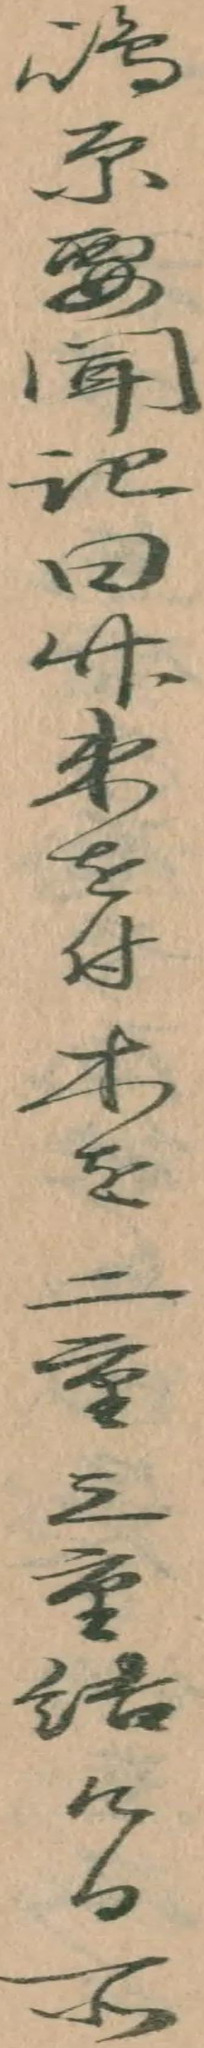島原要聞記曰竹束を付木を二重三重結ける所
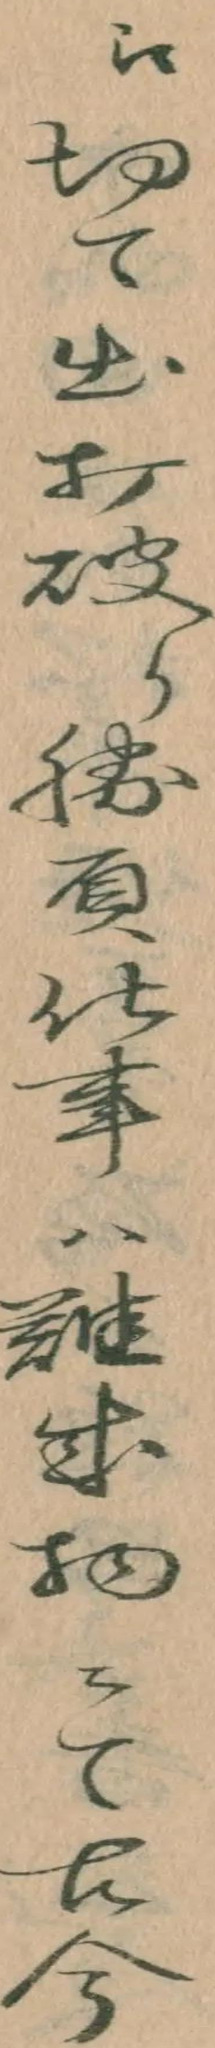江切て出打破り勝負仕事は難成物にて古今
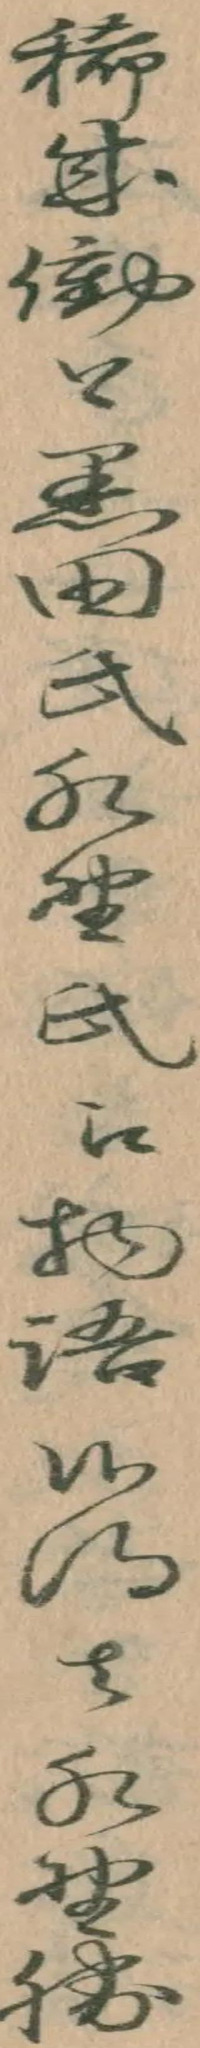稀成働と黒田氏水野氏江物語候得者水野勝
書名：切支丹御退治記 49巻. [7]
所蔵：国立国会図書館 National Diet Library, JAPAN
